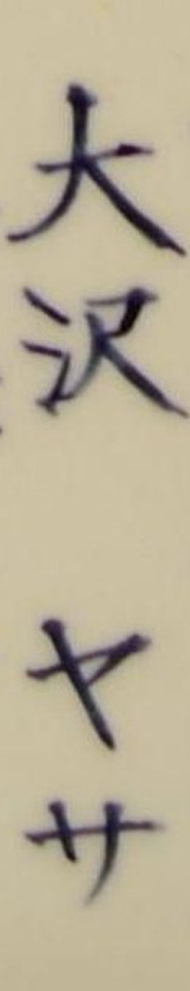大沢ヤサ
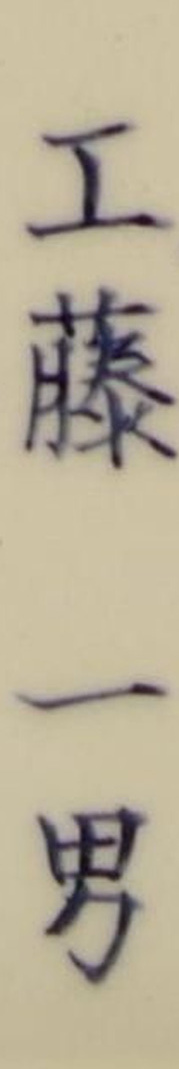工藤一男
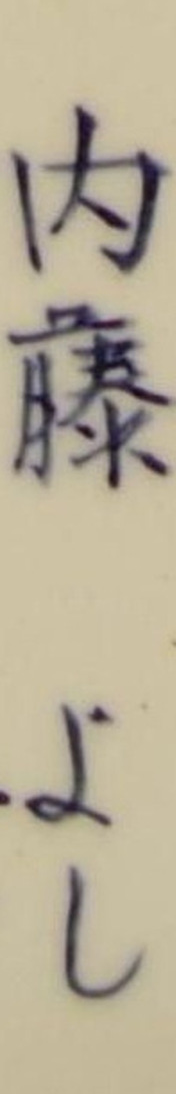内藤よし
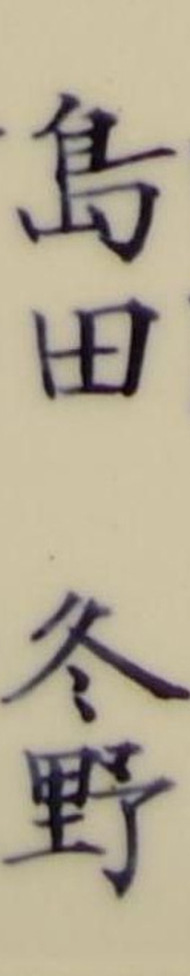島田冬野
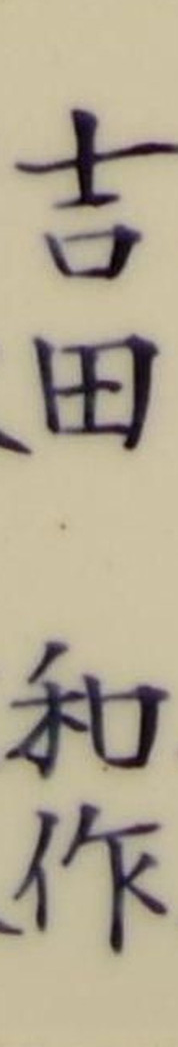吉田和作
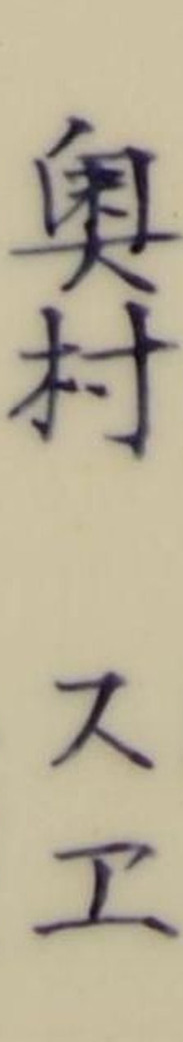奥村スエ
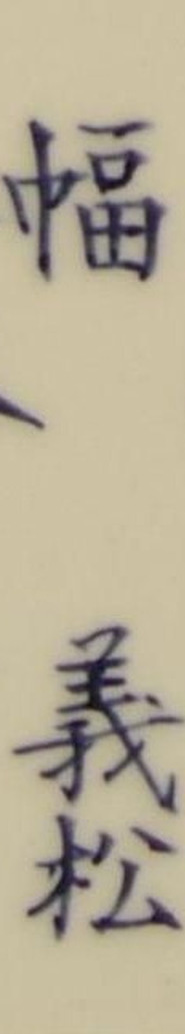幅義松
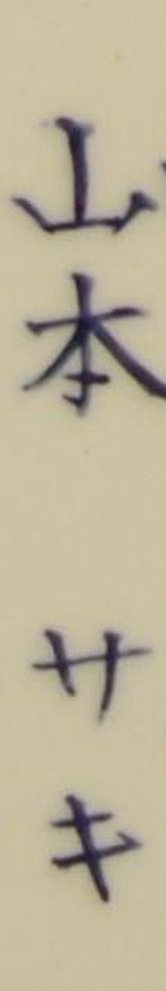山本サキ
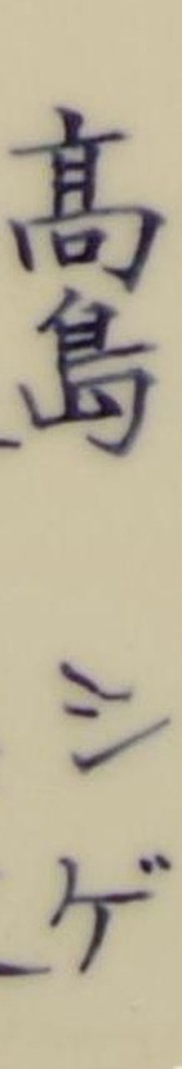高島シゲ
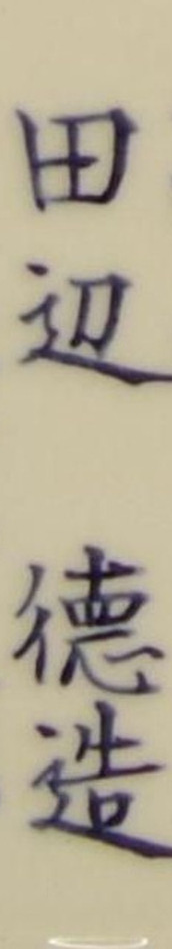田辺徳造
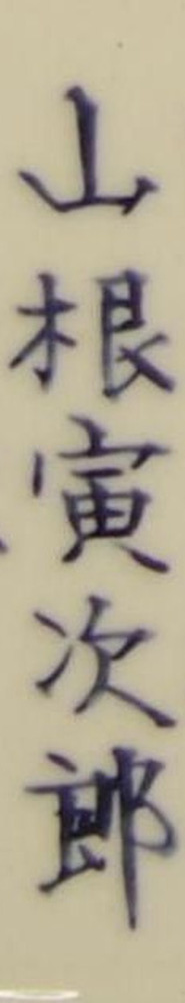山根寅次郎
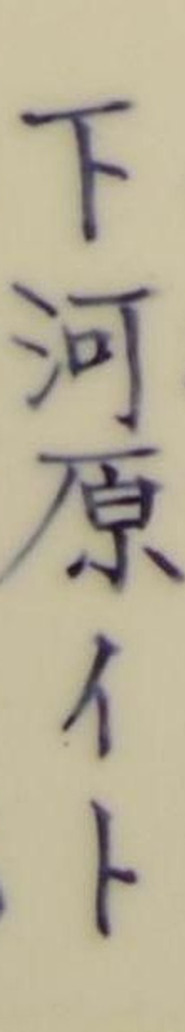下河原イト
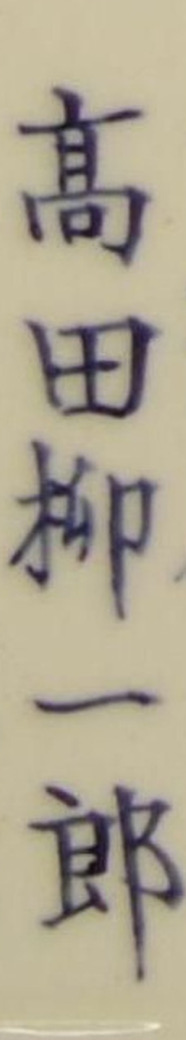高田柳一郎

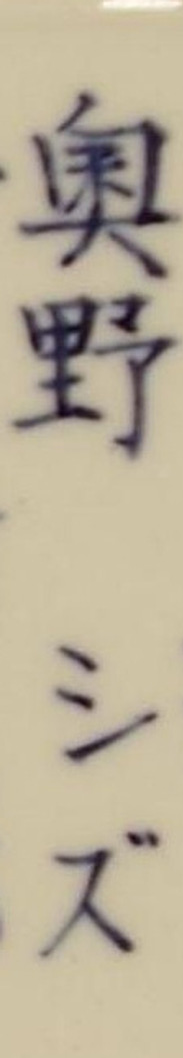奥野シズ
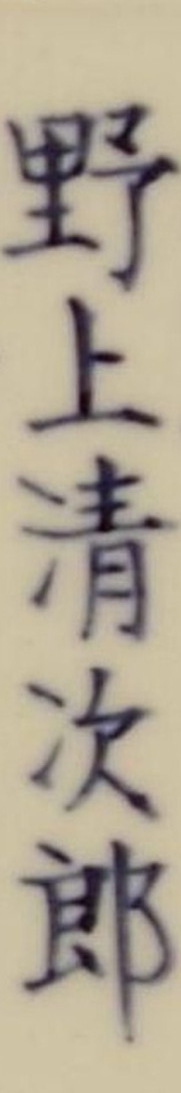野上清次郎
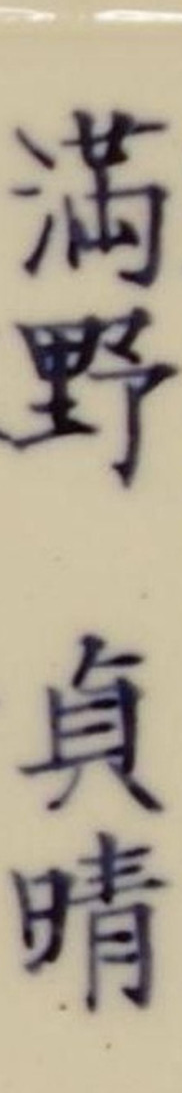滿野貞晴
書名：E~L
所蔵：高野山金剛峯寺
